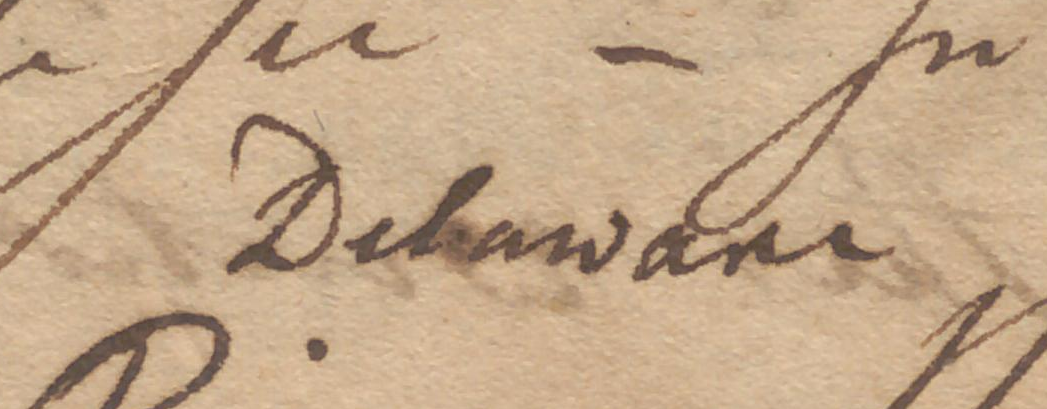Delaware
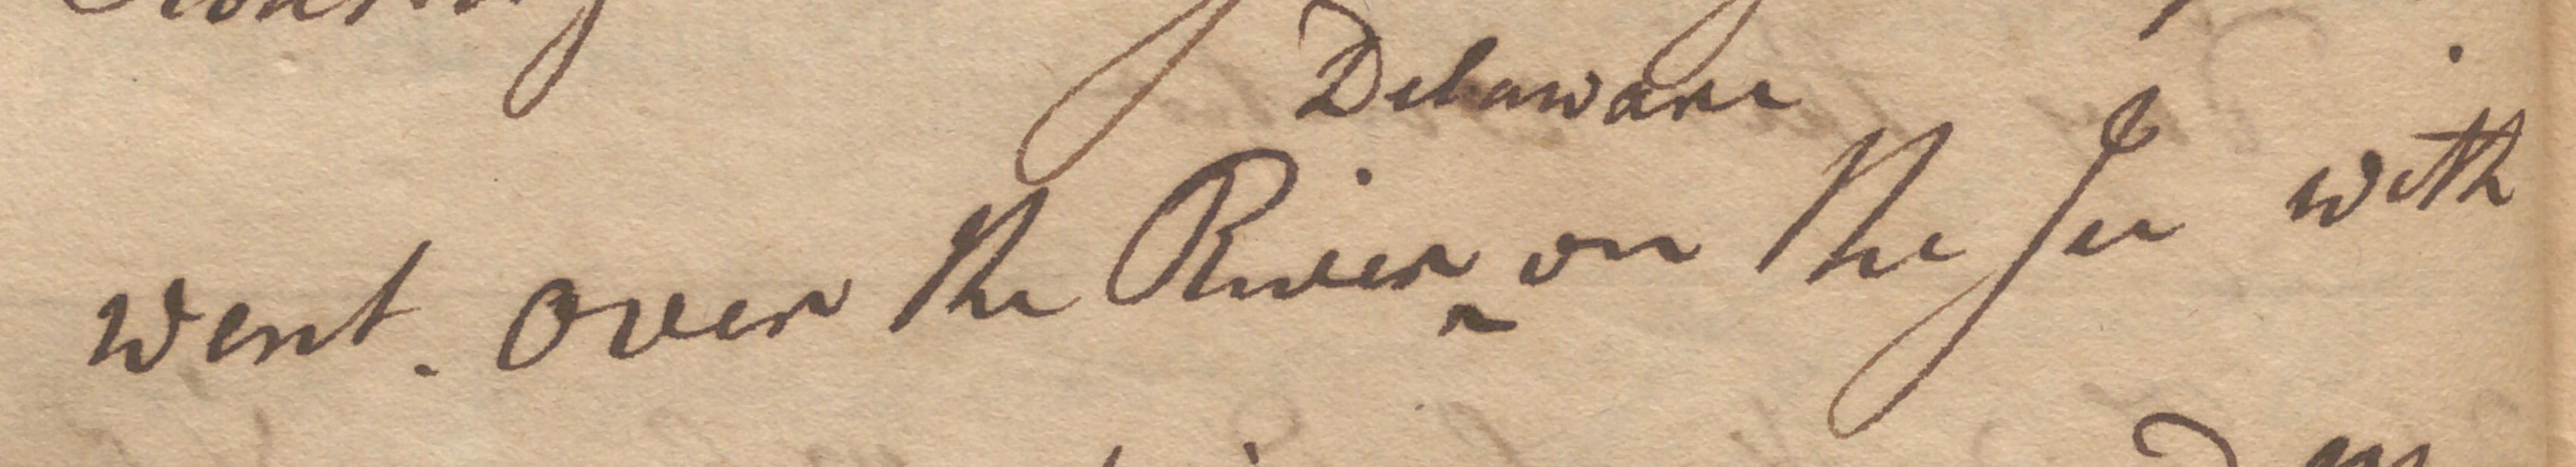went. over the River on the Ice with
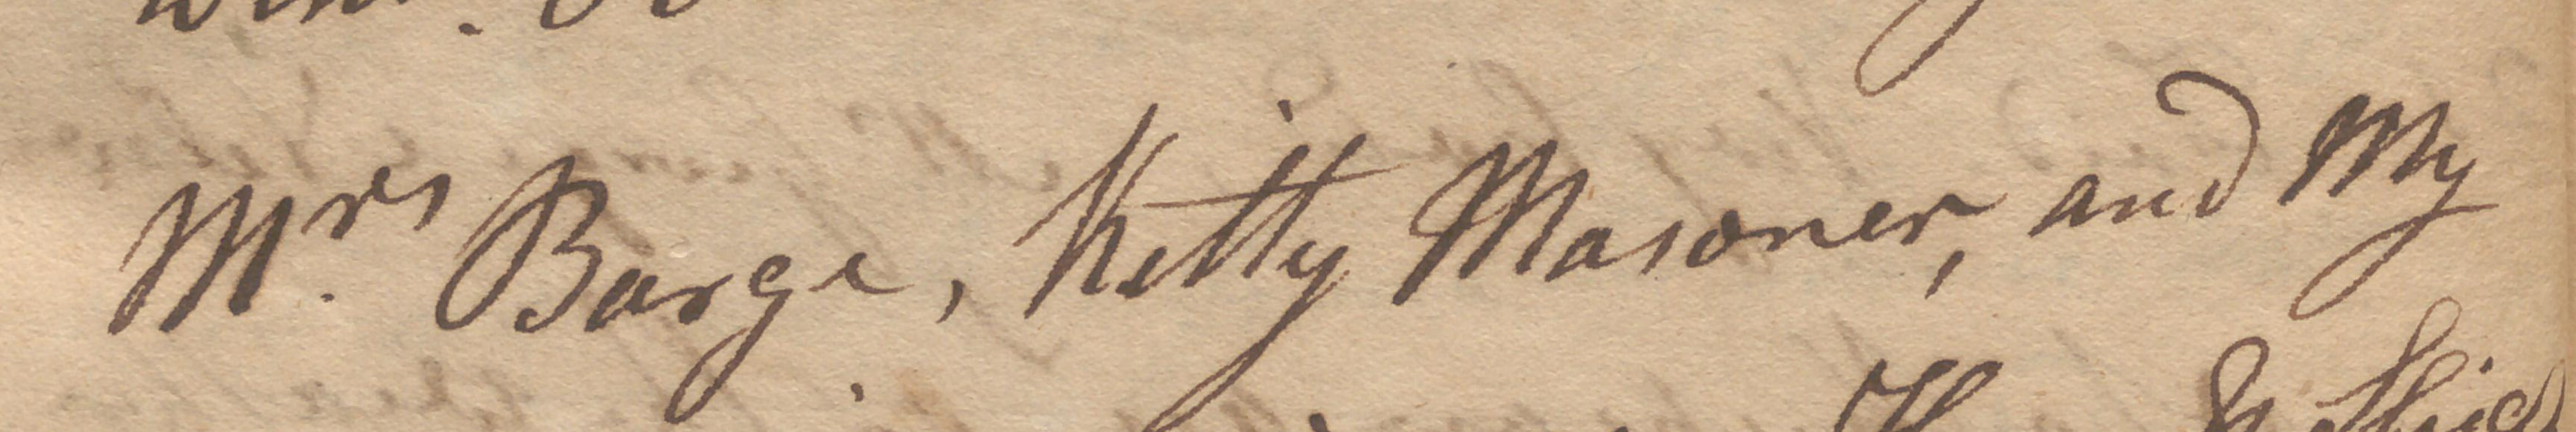M^rs. Barge, Kitty Masoner and My
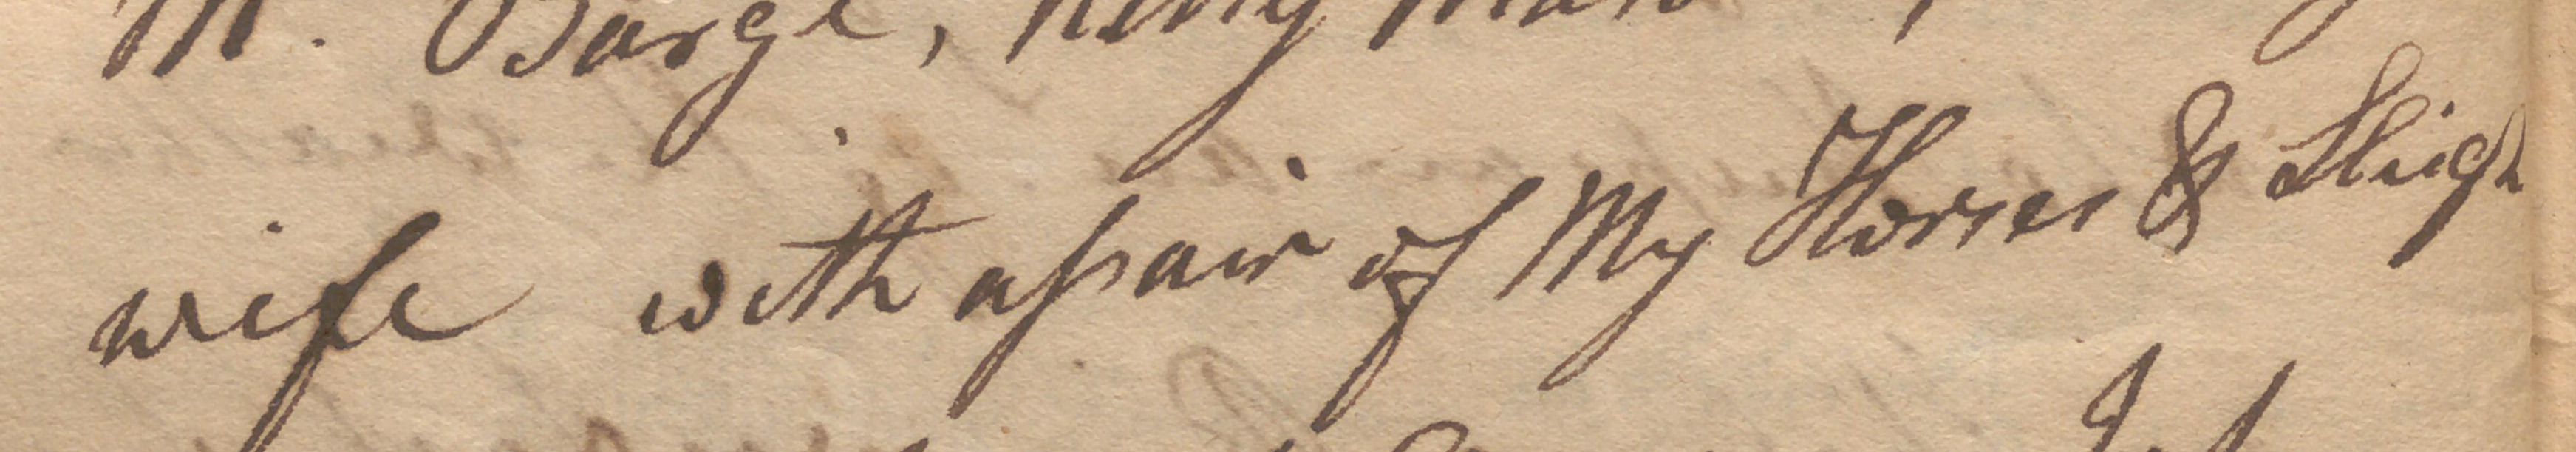wife with a pair of My Horses & Sleigh
